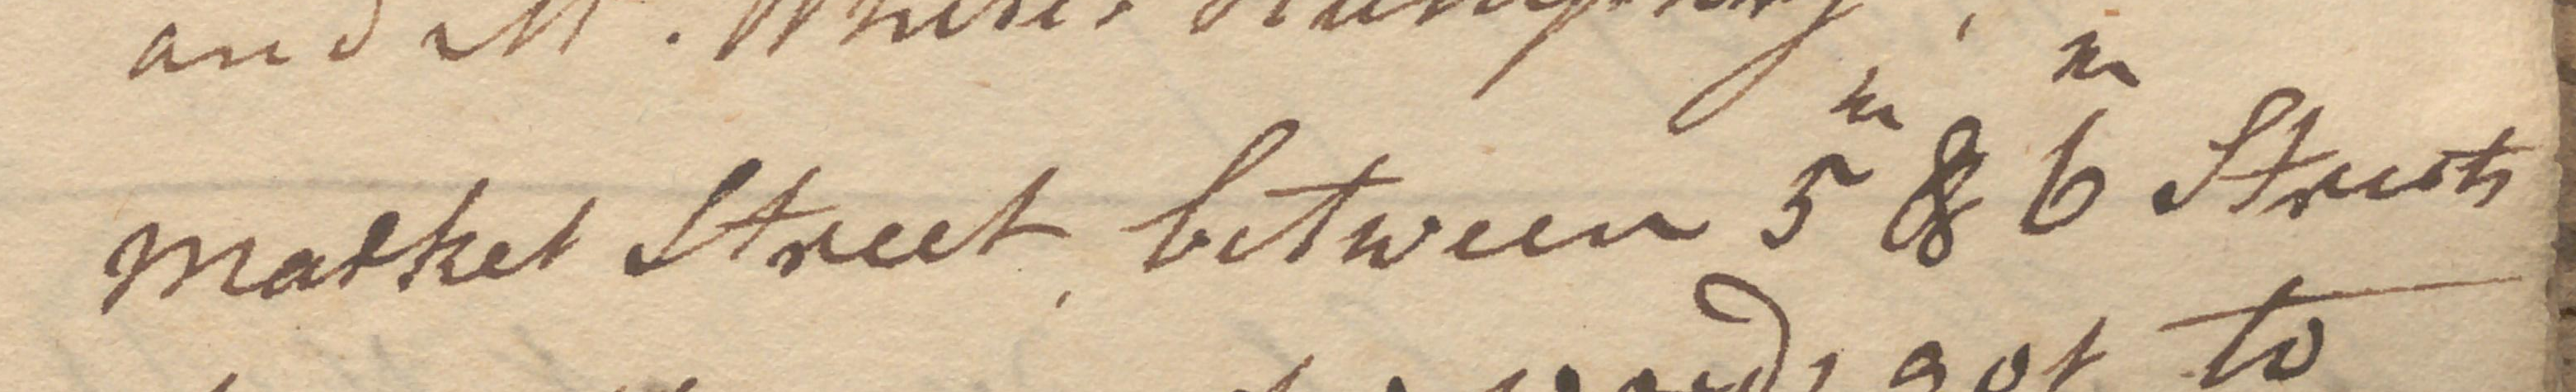market Street between 5^th & 6^th Streets
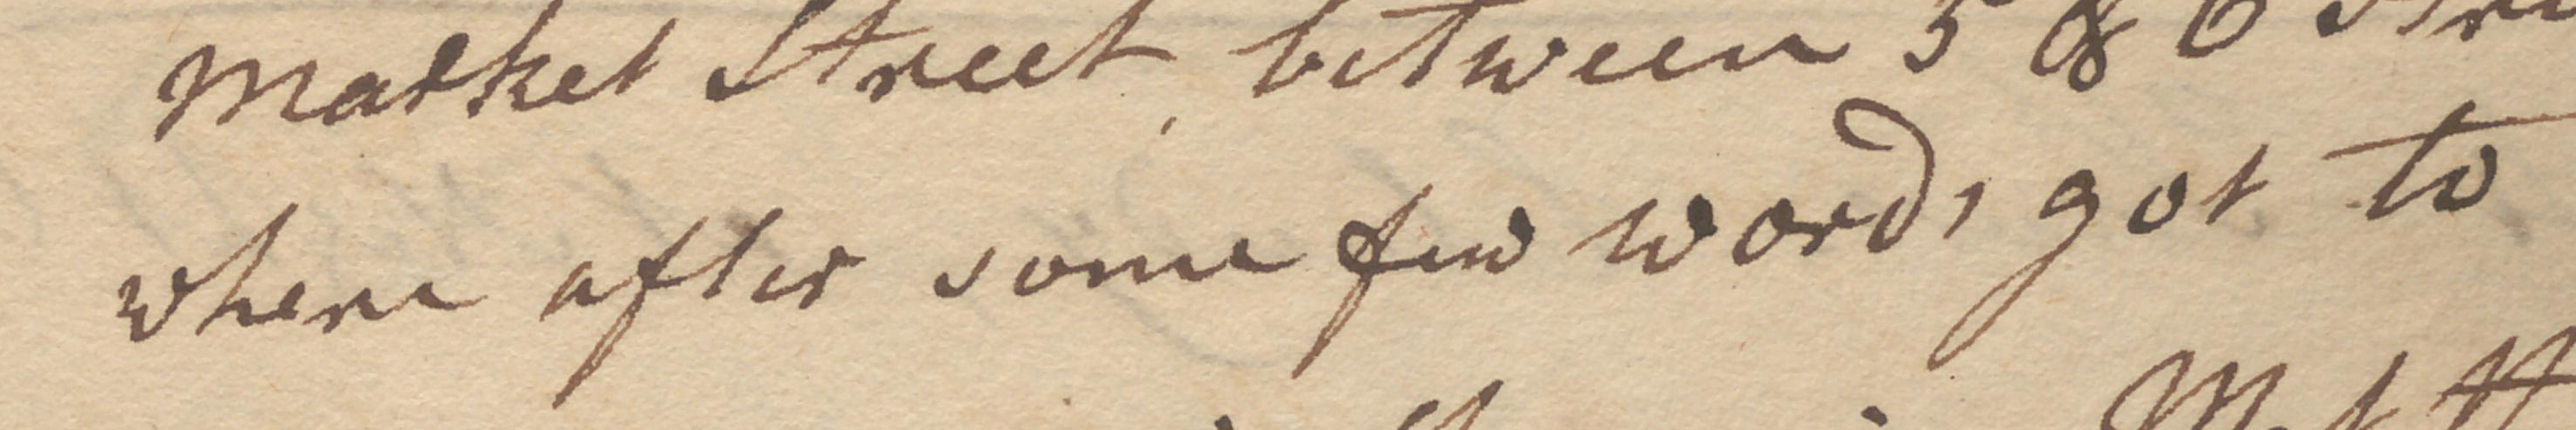where after some few words got to
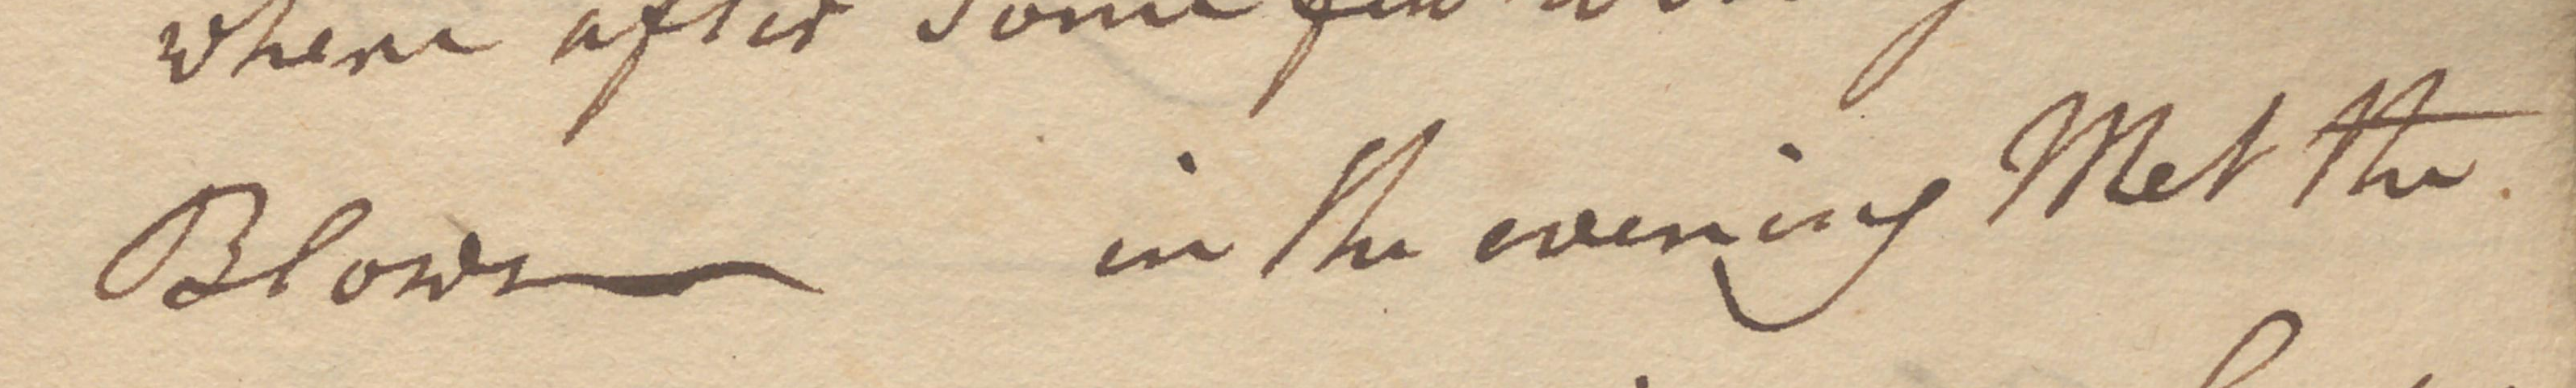Blows- in the evening Met the
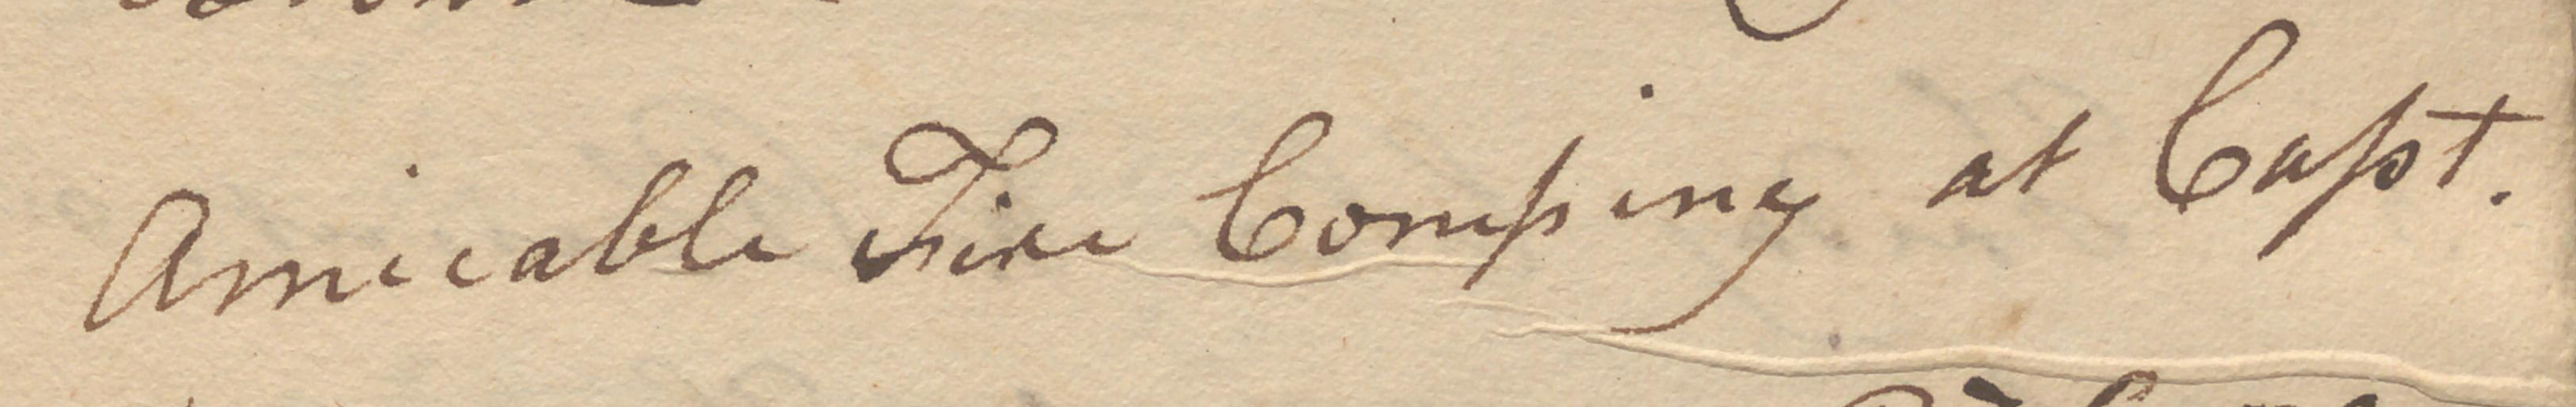Amicable Fire Comping at Capt.
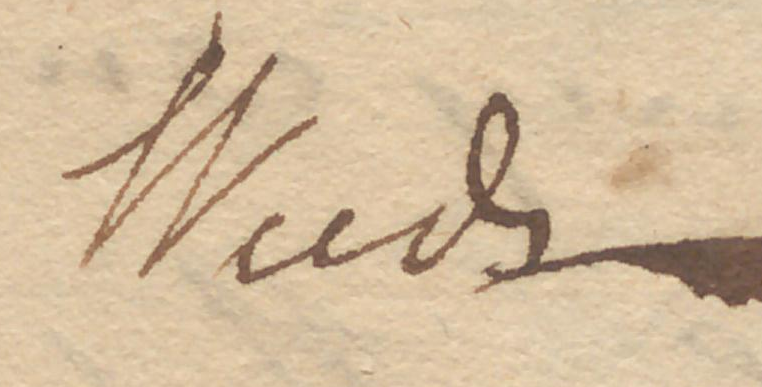Weeds
